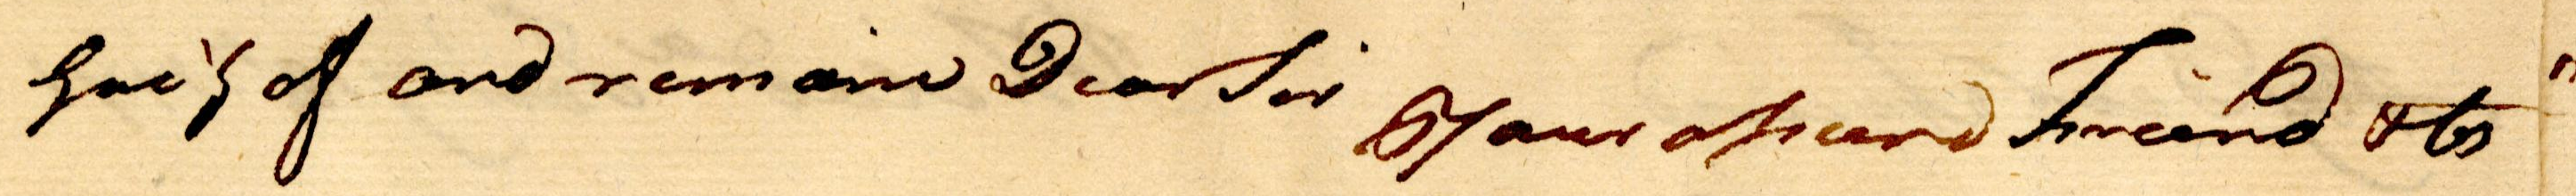goe's of and remain Dear Sir your assurd friend &c
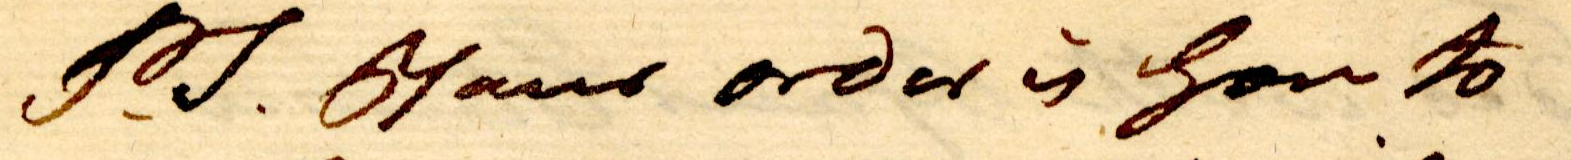PS. your order is gon to
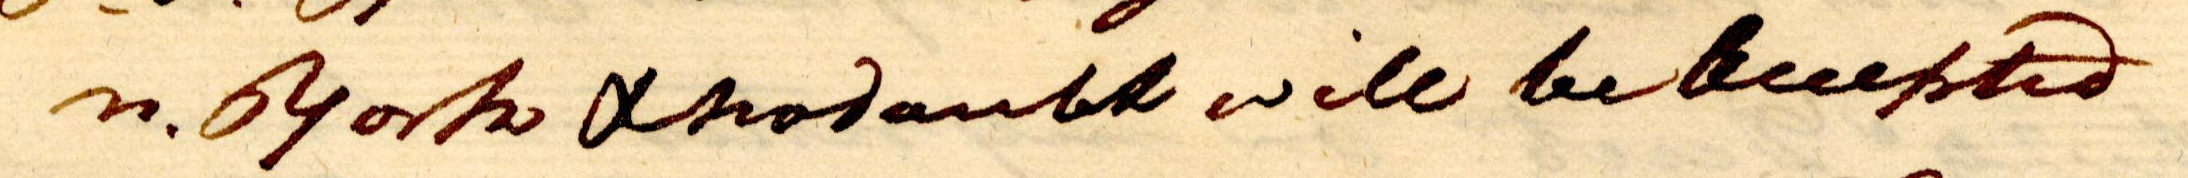n. York & no doubt will be accepted
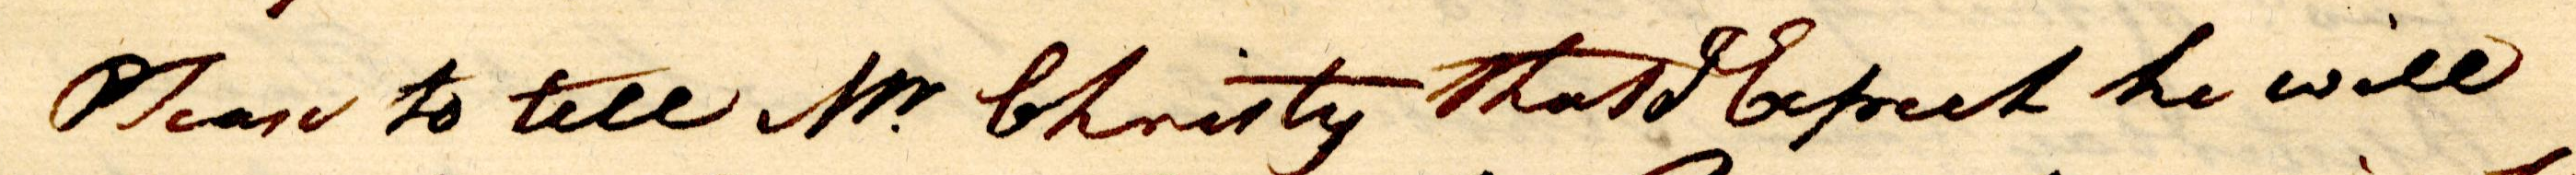please to tell M^r. Christy that I Expect he will
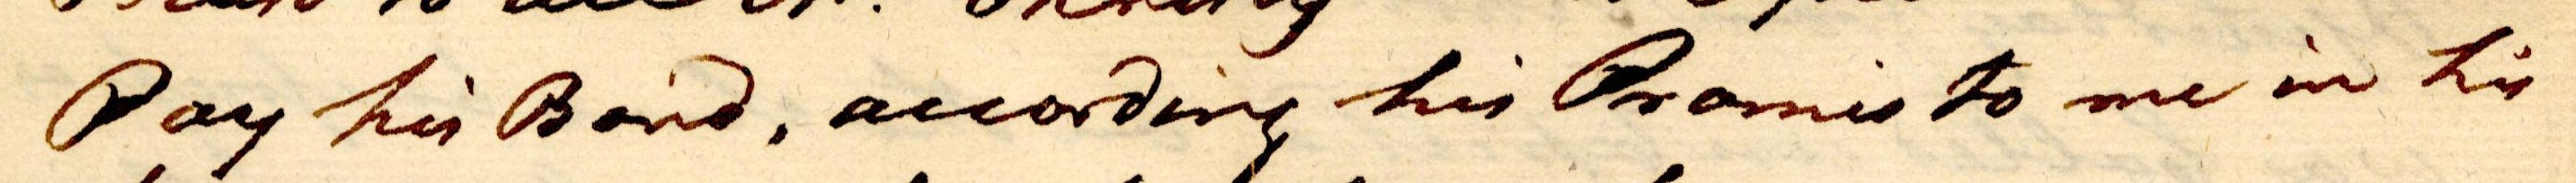pay his Bond, according his promis to me in his
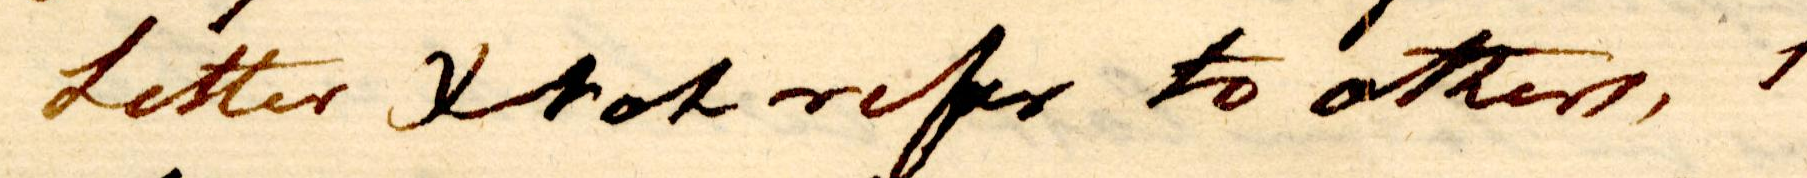Letter & not refer to others,
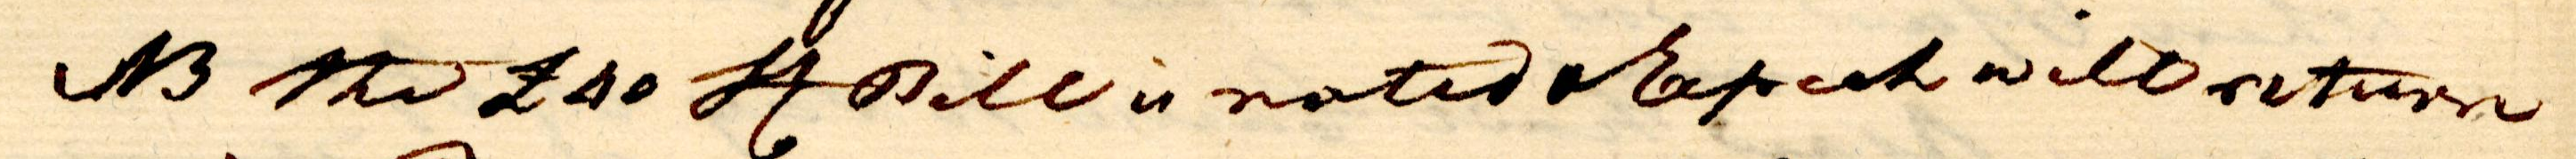NB the £40 st Bill is noted & Expect will return
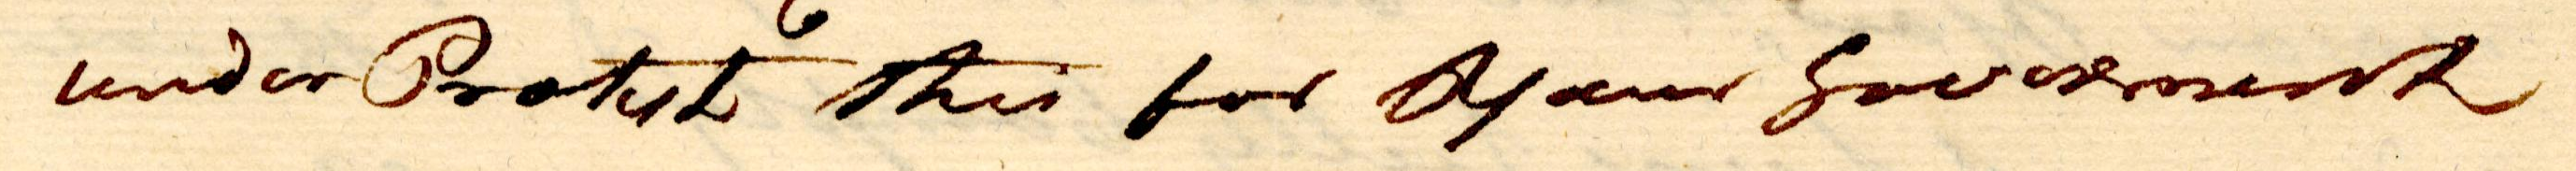under Protest this for your Goverment
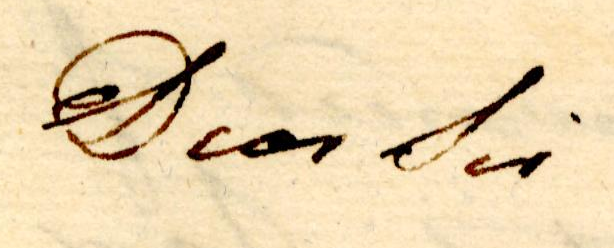Dear Sir
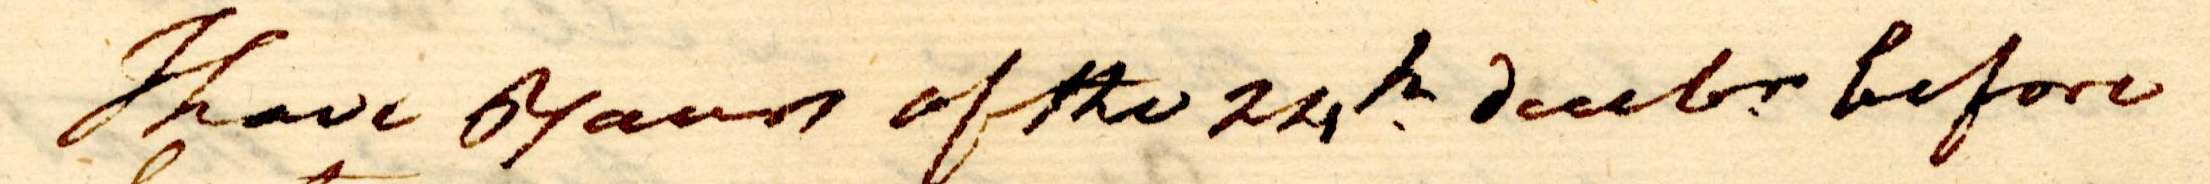I have yours of the 24^th. deceb^r before
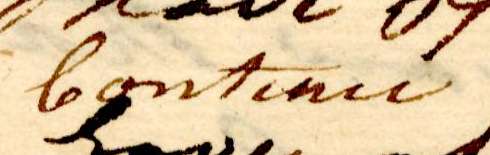Continue
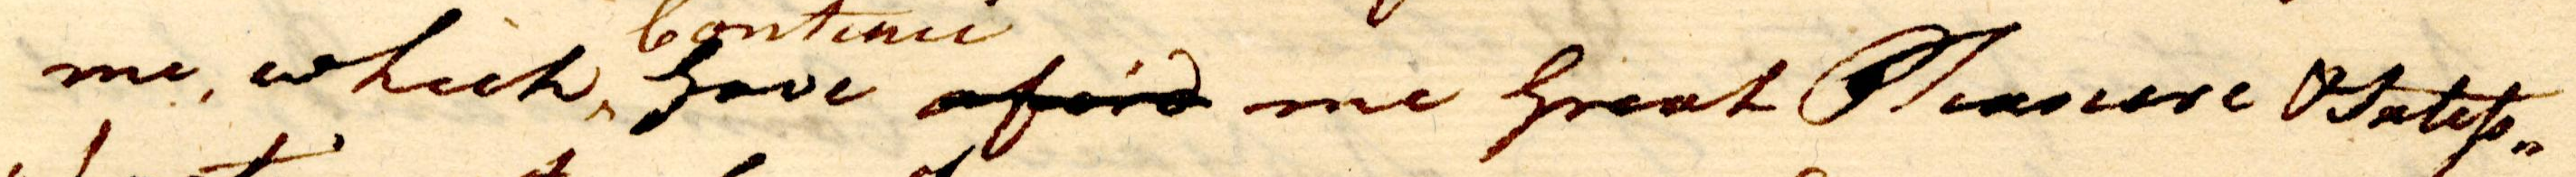me which ^ gave [aford] me great Pleasure & satis-
